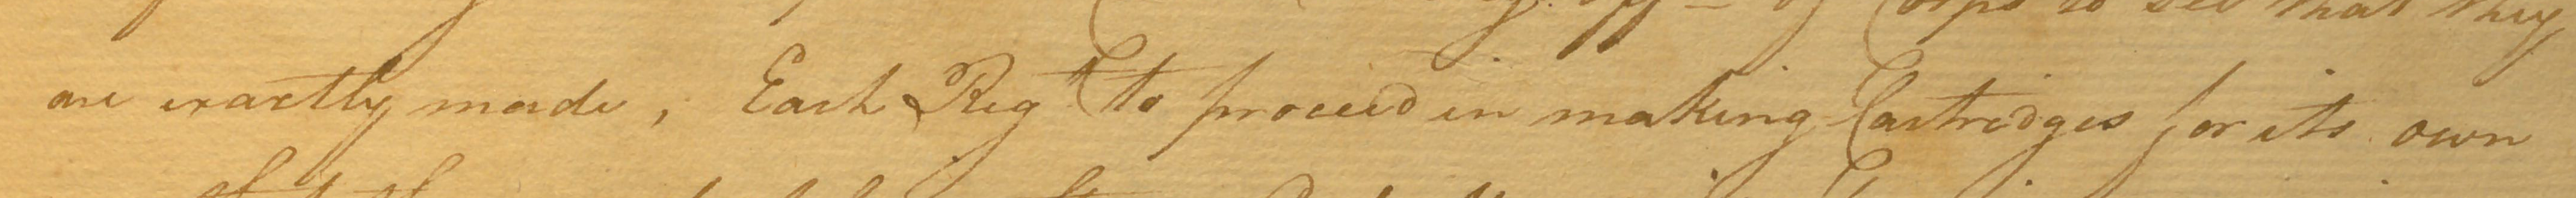are exactly made, Each Reg^t to proceed in making Cartridges for its own
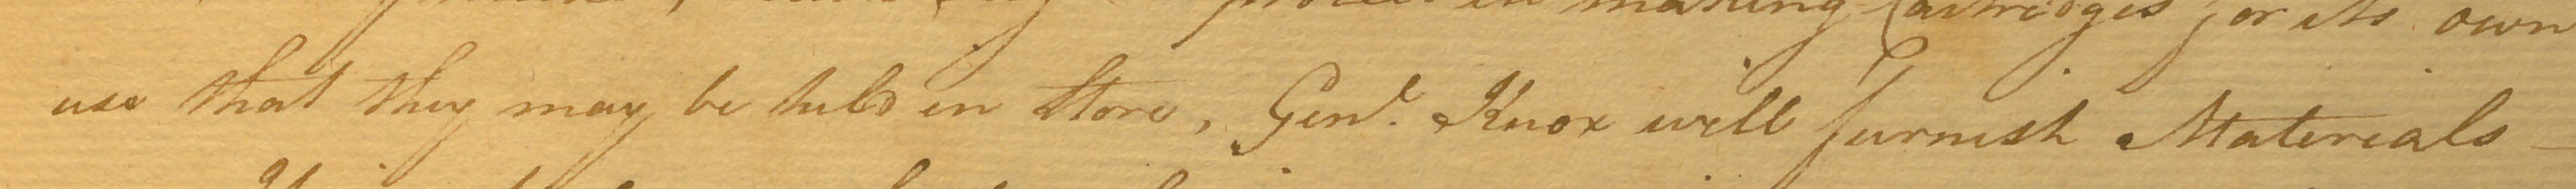use that they may be held in Store. Gen^l. Knox will furnish Materials
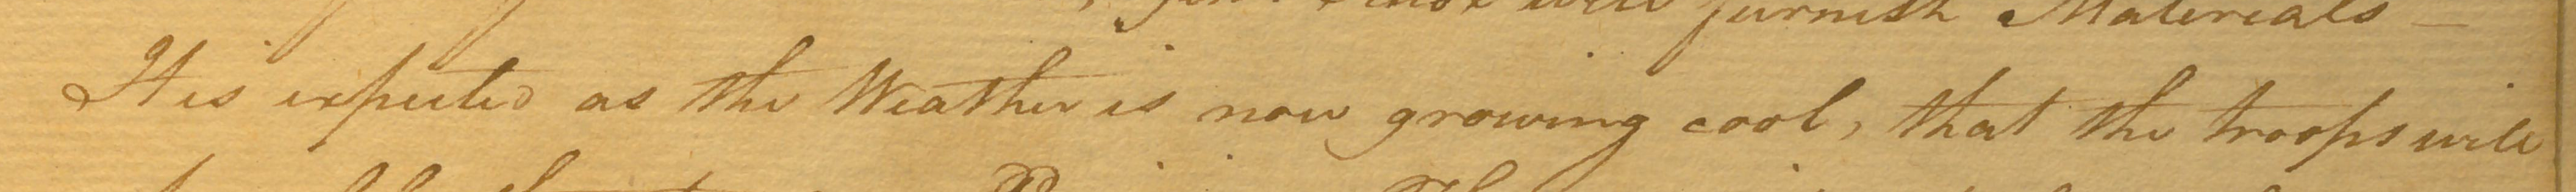It is expected as the Weather is now growing cool, that the troops will
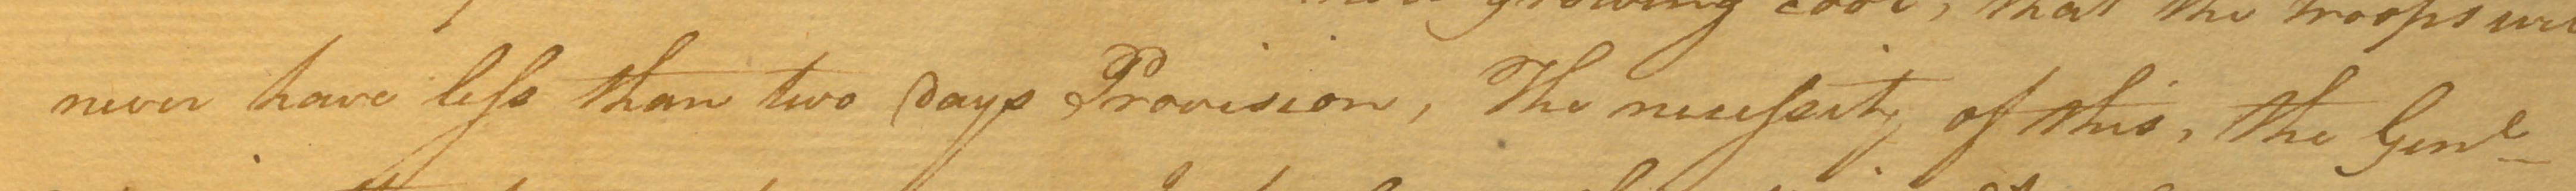never have less than two days Provisions, The necessity of this, the Gen^l.
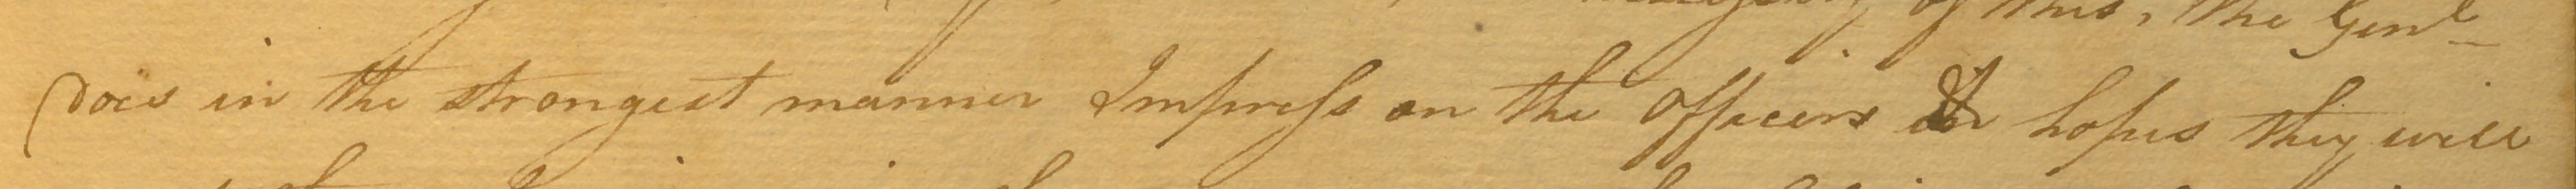does in the strongest manner Impress on the Officers & hopes they will
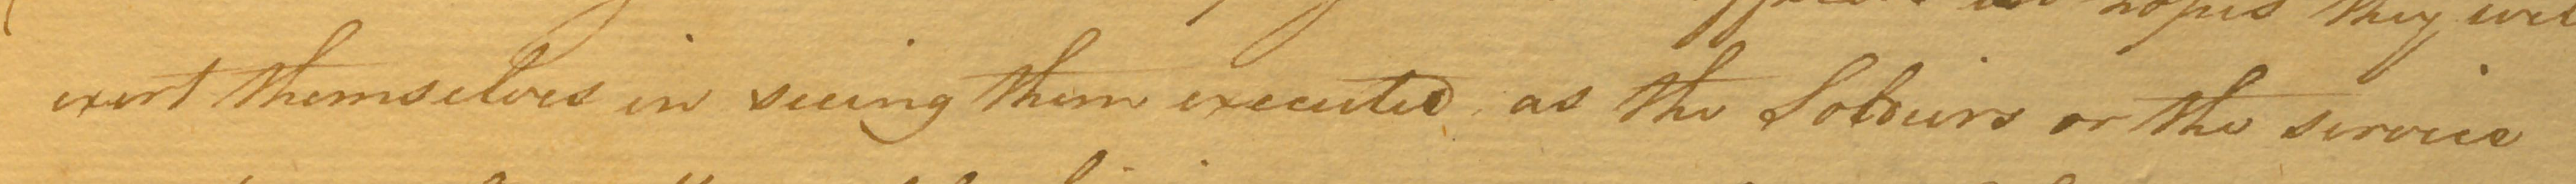exert themselves in seeing them executed as the Soldiers or the service
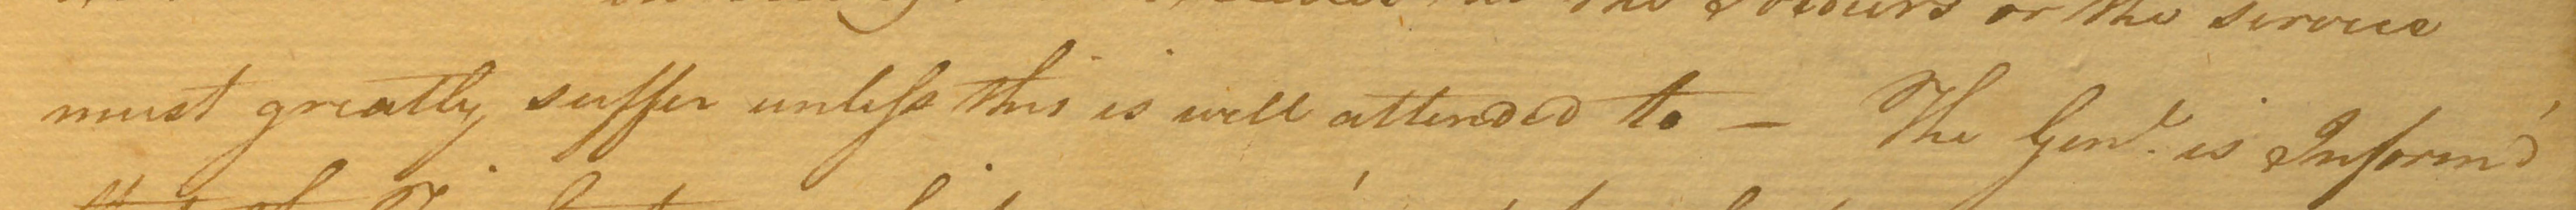must greatly suffer unless this is well attended to- The Gen^l. is Inform'd
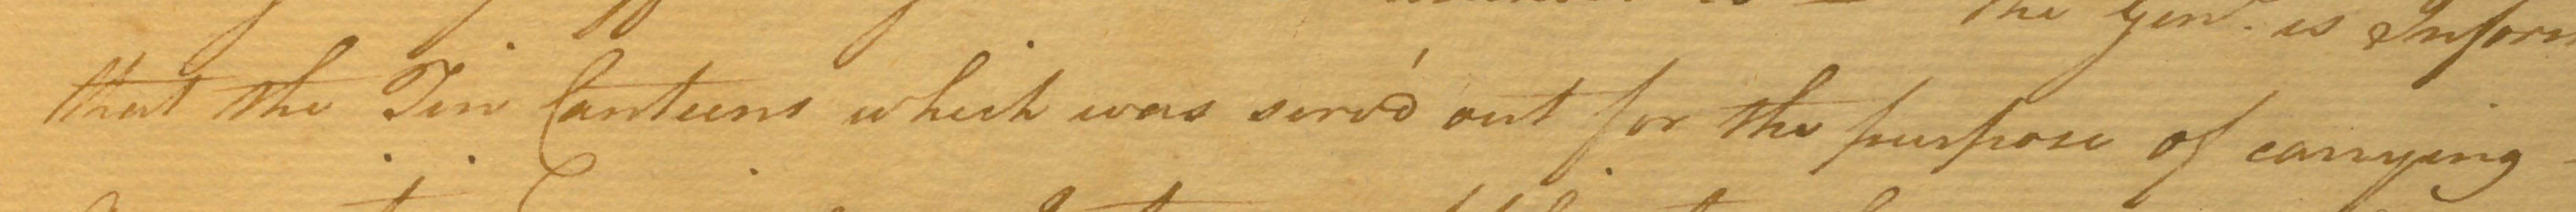that the Tin Canteens which was serv'd out for the purpose of carrying
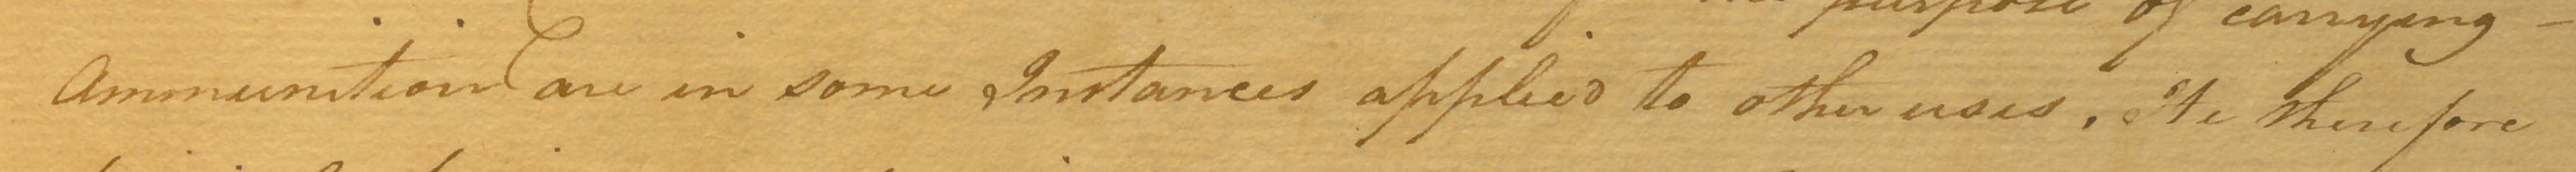Ammunition are in some Instances applied to other uses. He therefore
